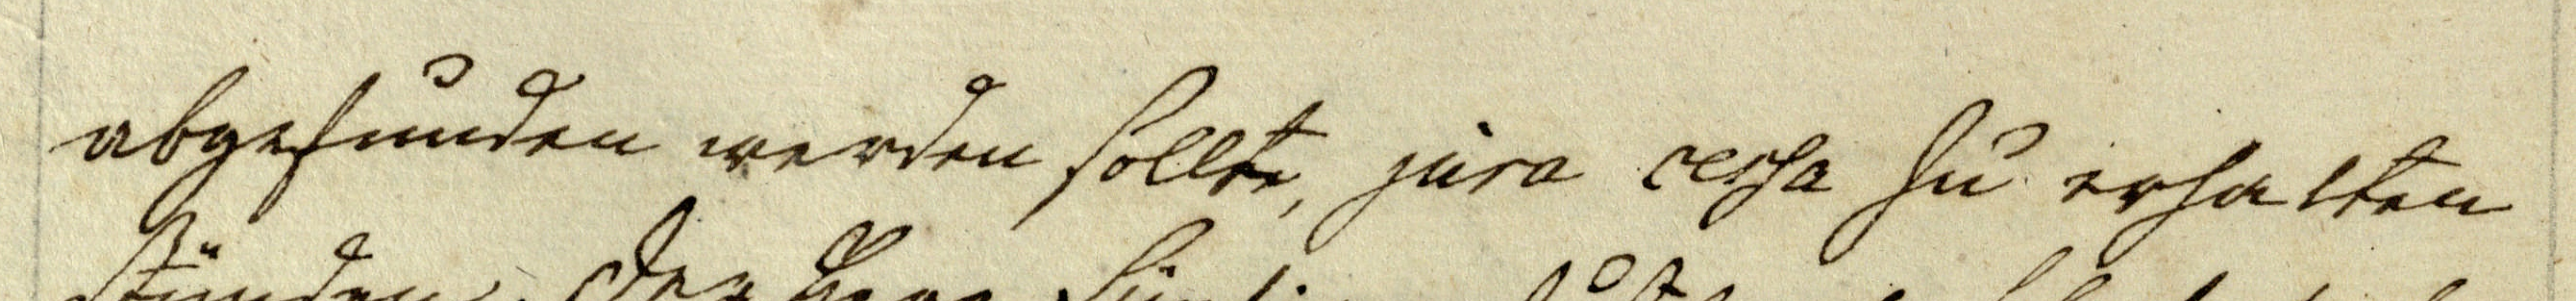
abgefunden werden sollte, jura cessa zu erhalten
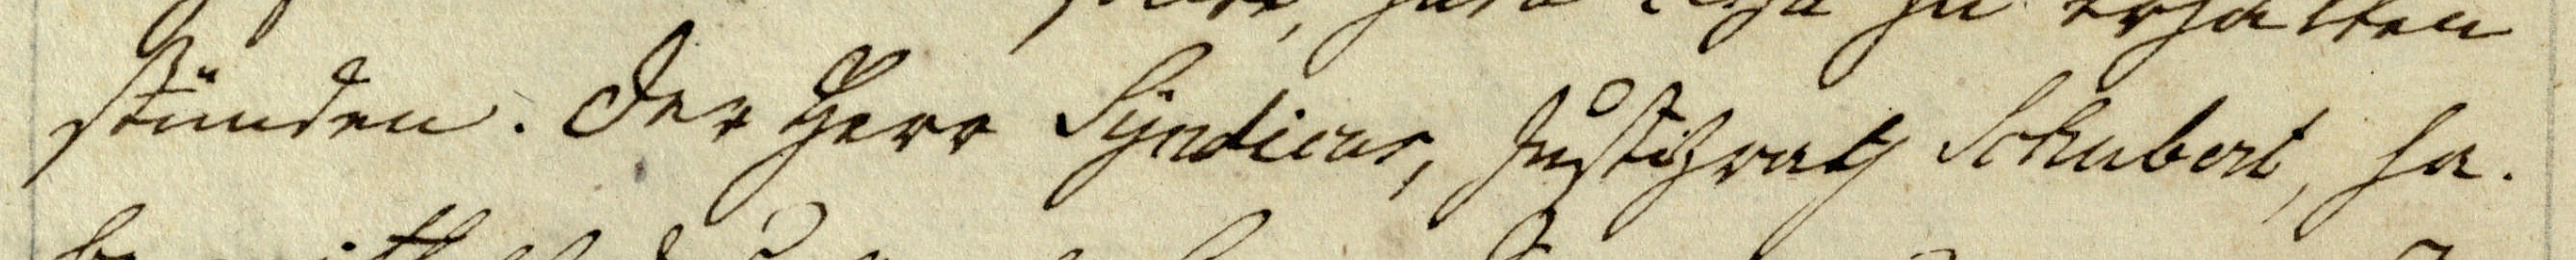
stünden. Der Herr Sÿndicus, Justizrath Schubert, ha¬
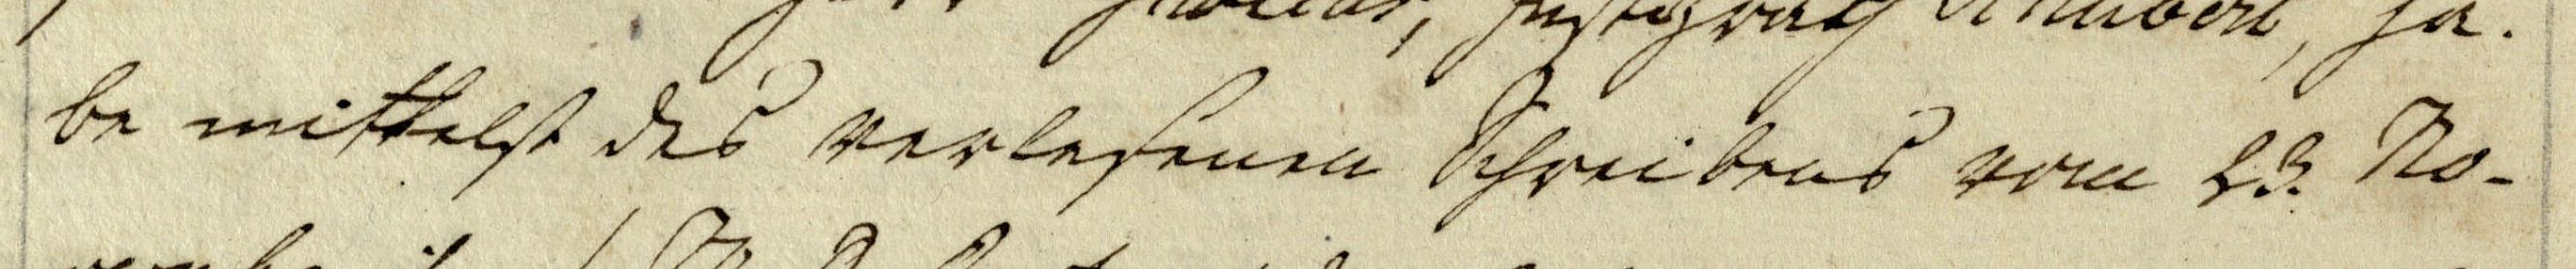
be mittelst des verlesenen Schreibens vom 23. No¬
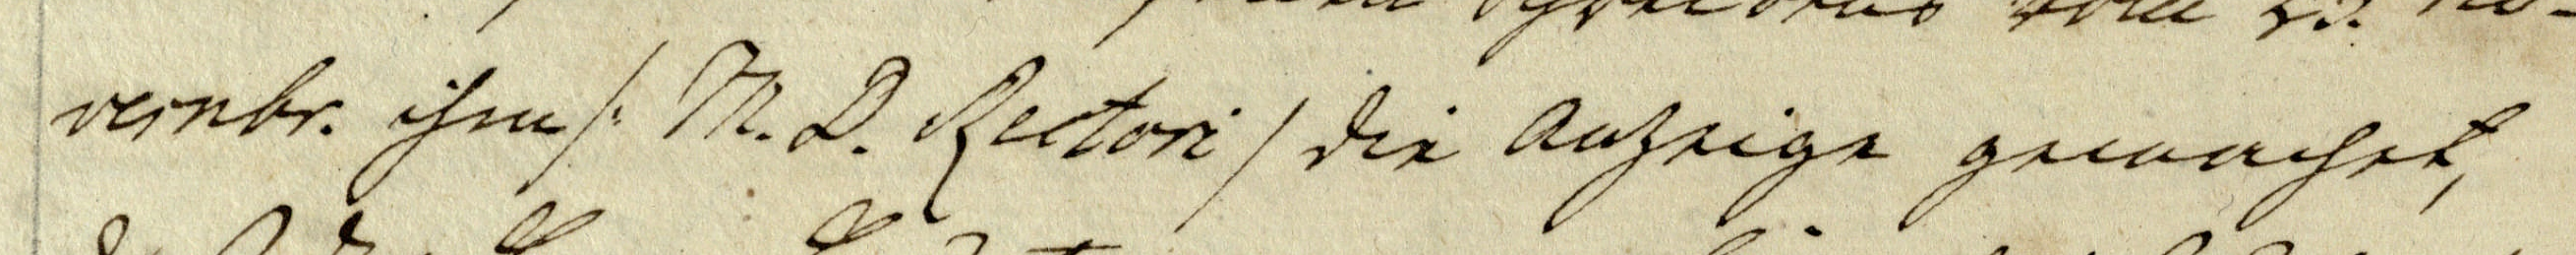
vembr. ihm /. M. D. Rectori / die Anzeige gemachet,
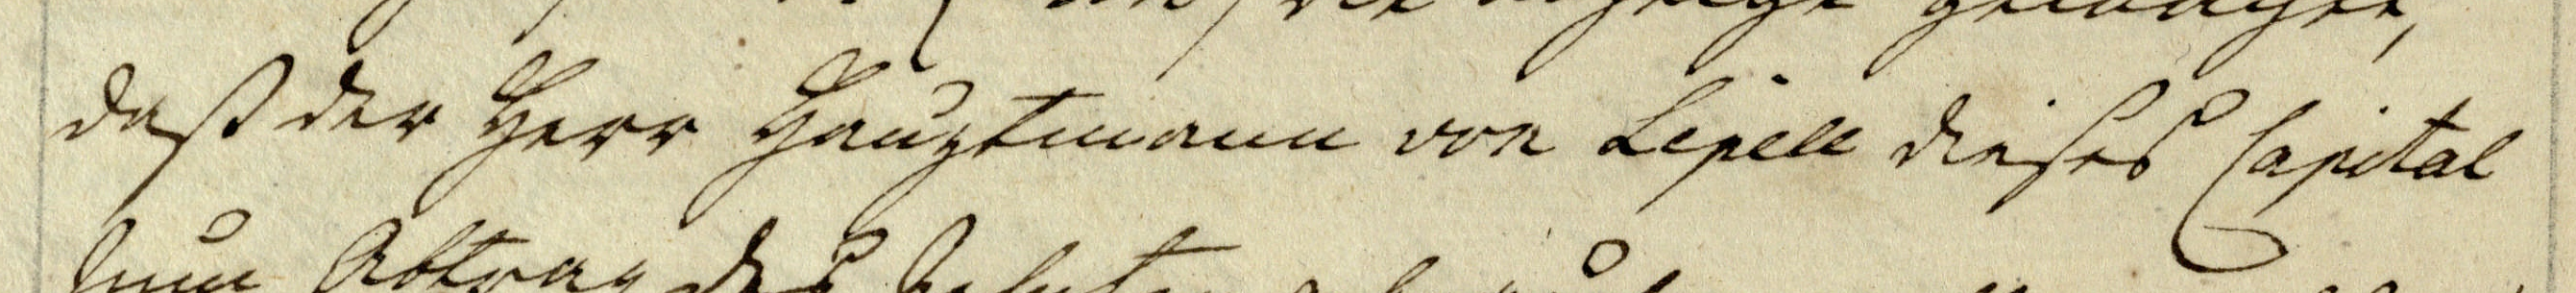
daß der Herr Hauptmann von Lepell dieses Capital
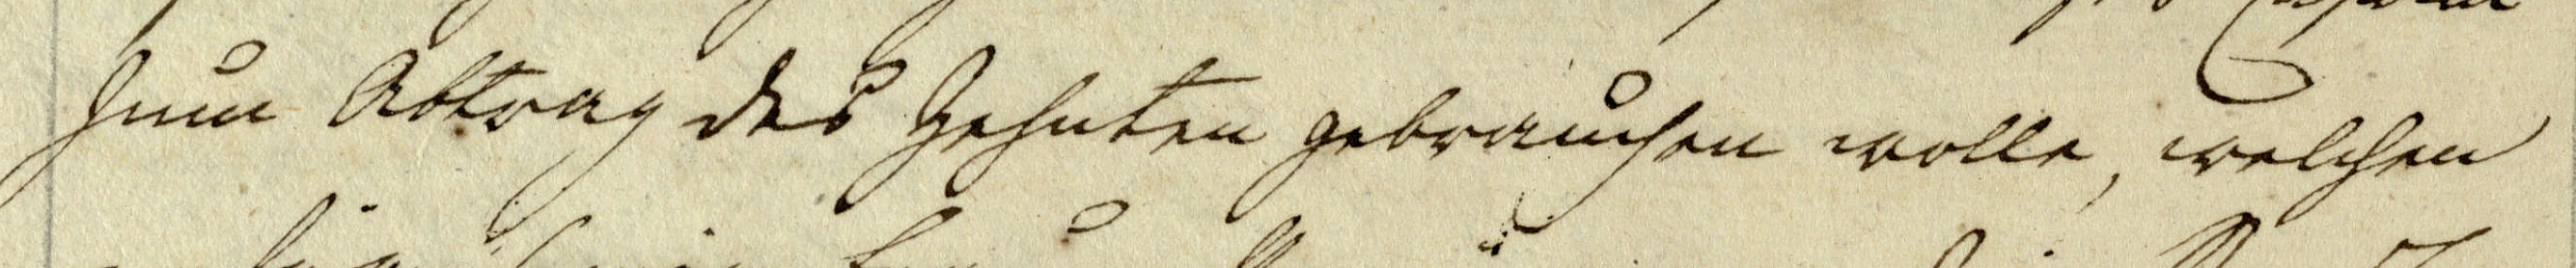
zum Abtrag des Zehnten gebrauchen wolle, welchen
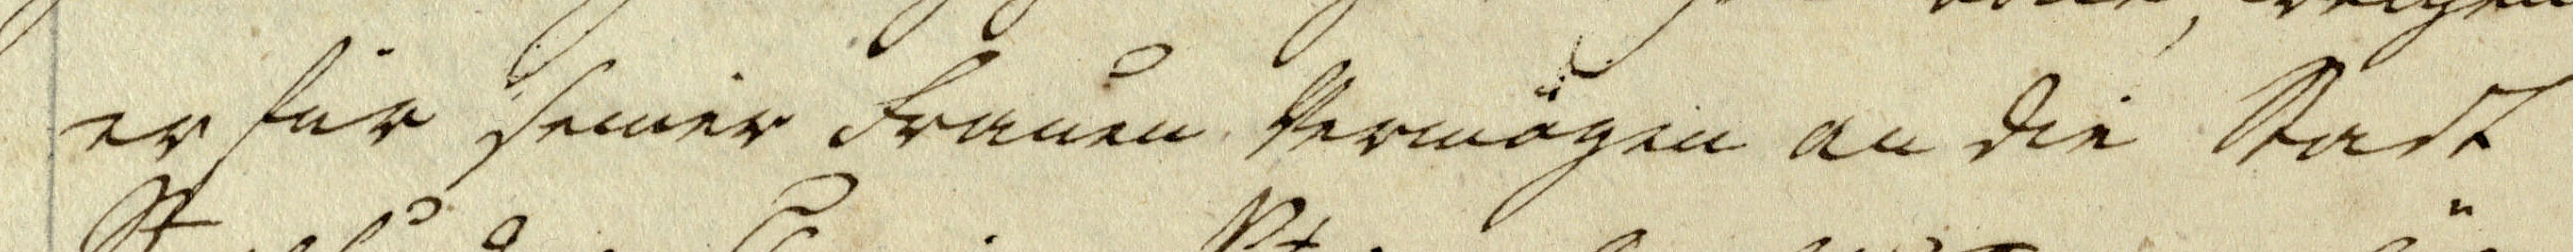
er für seiner Frauen Vermögen an die Stadt
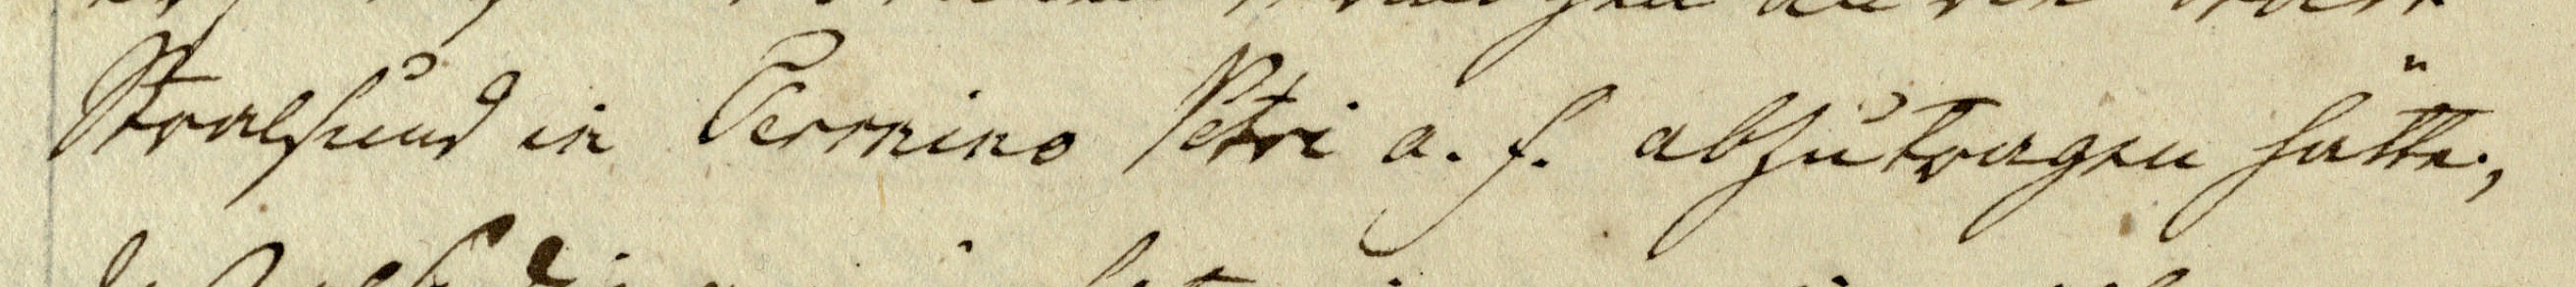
Stralsund in Termino Petri a. f. abzutragen hätte,
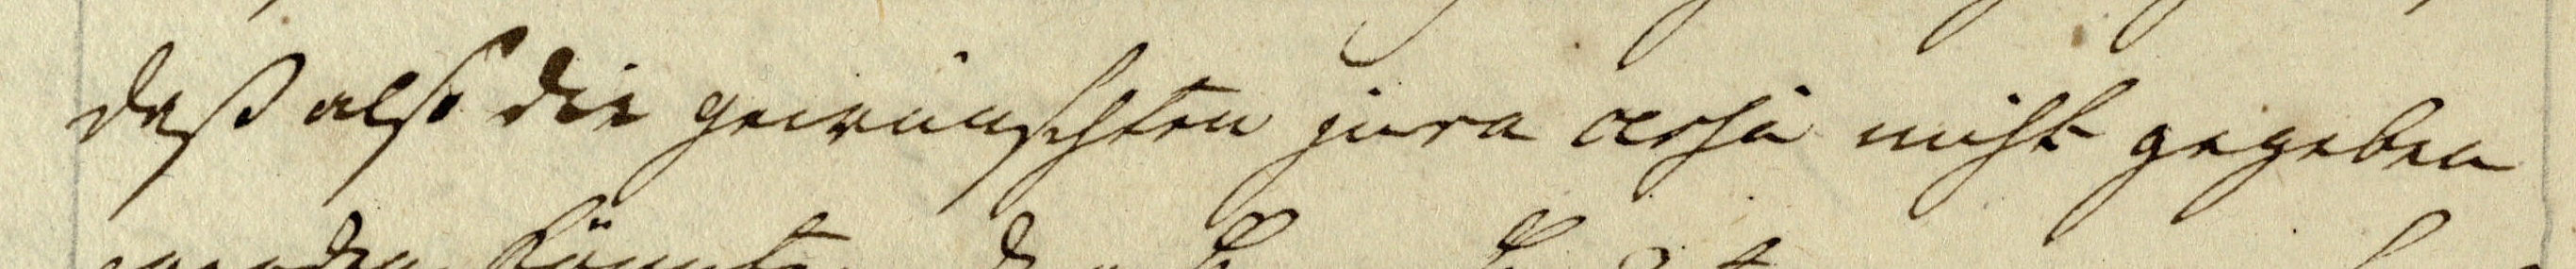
daß also die gewünschten jura cessa nicht gegeben
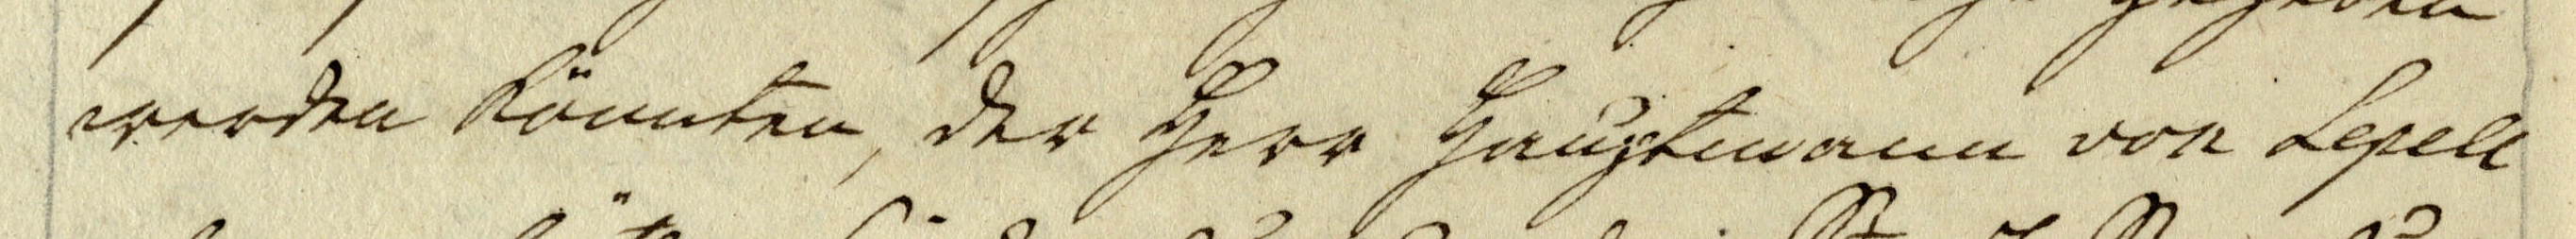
werden könnten, der Herr Hauptmann von Lepell
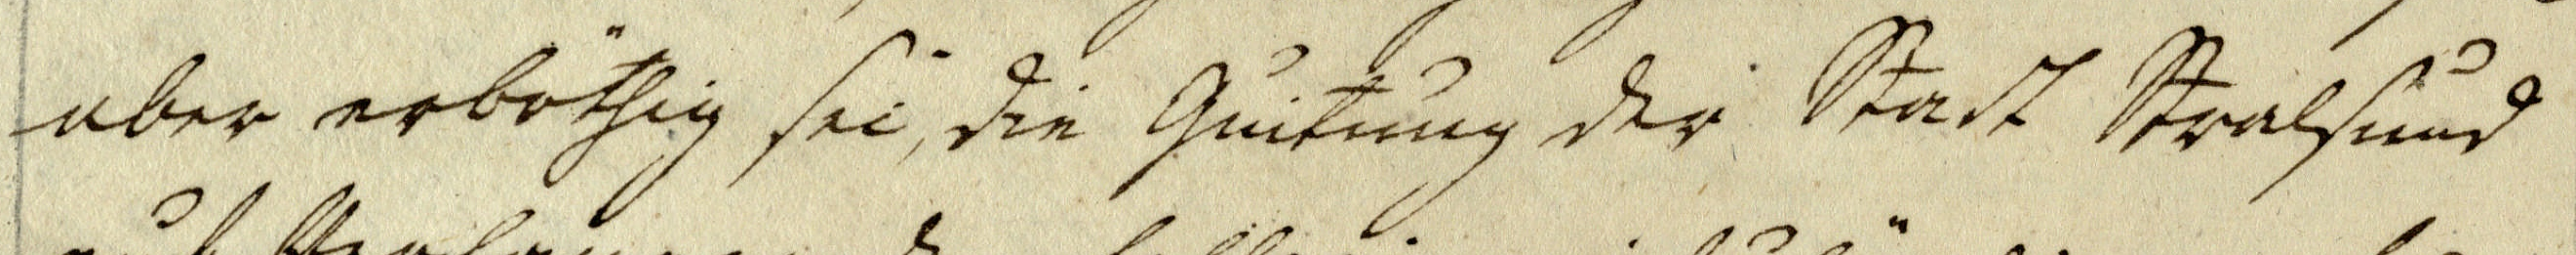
aber erböthig sei, die Quitung der Stadt Stralsund
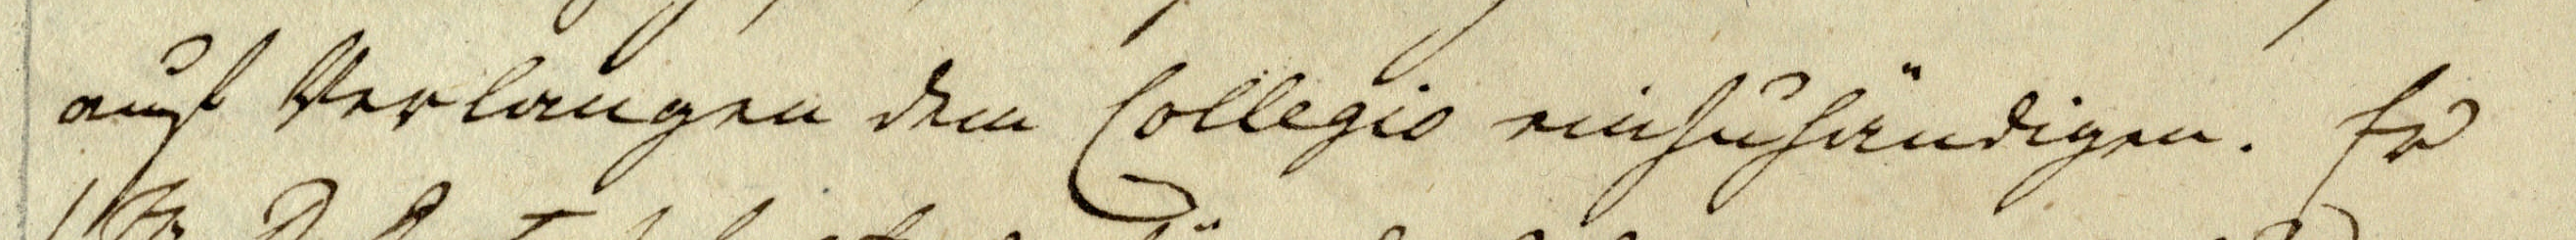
auf Verlangen dem Collegio einzuhändigen. Er
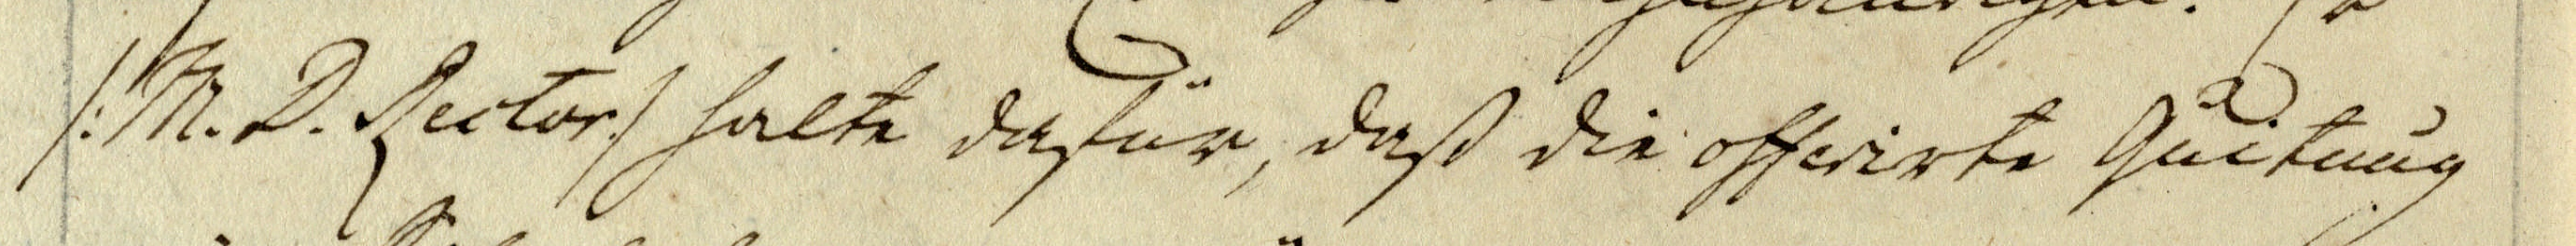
/: M. D. Rector ./ halte dafür, daß die offerirte Quitung
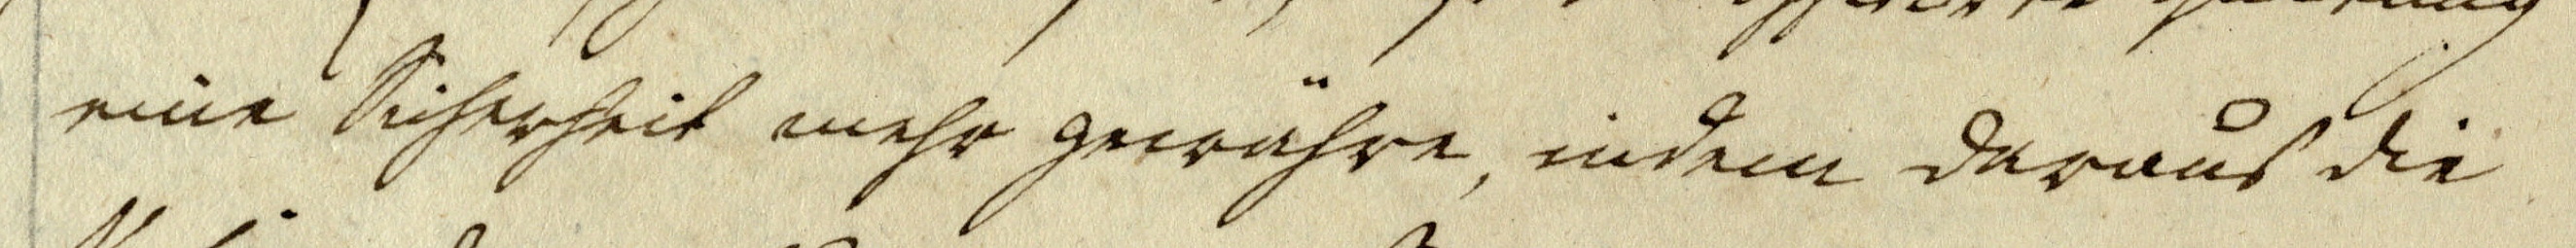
eine Sicherheit mehr gewähre, indem daraus die
